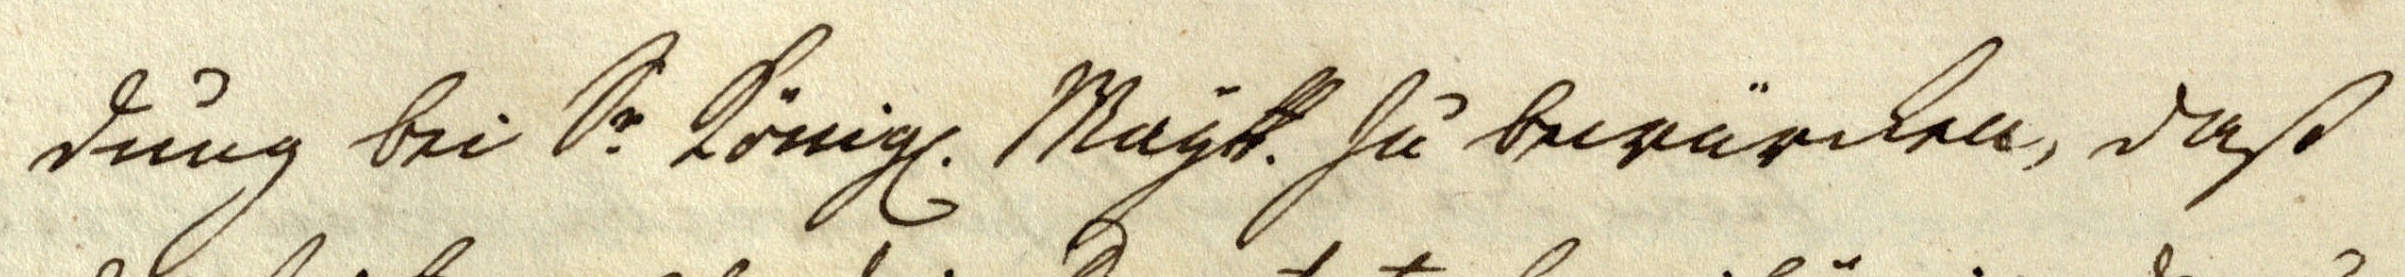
dung bei Sr Königl. Maÿtt: zu bewürcken, daß
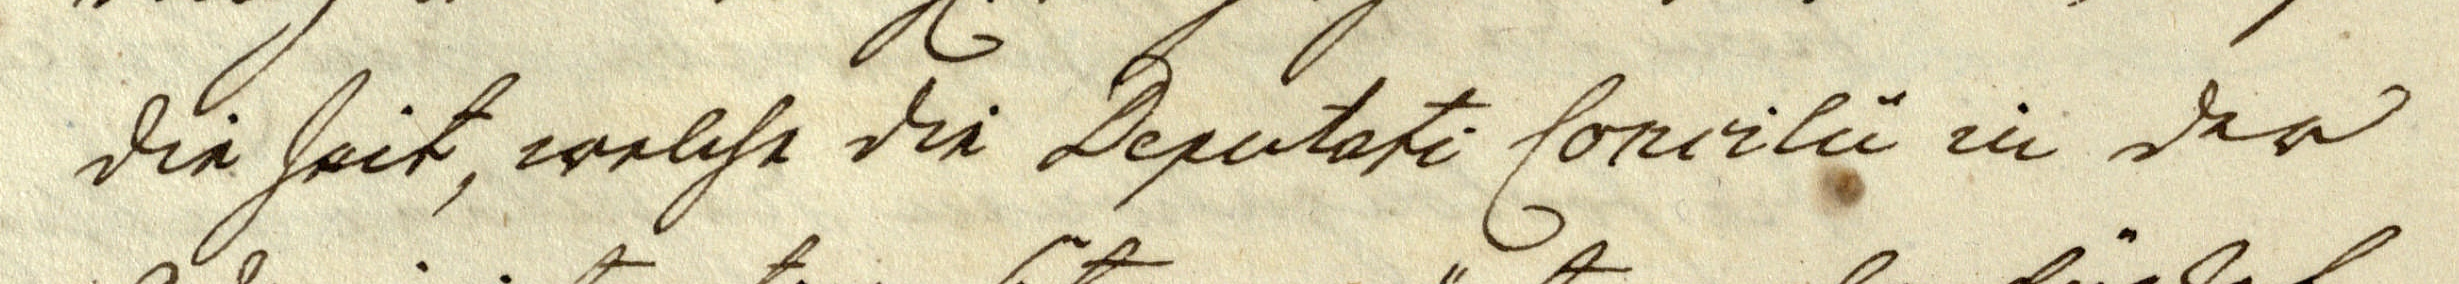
die Zeit, welche die Deputati Concilii in der
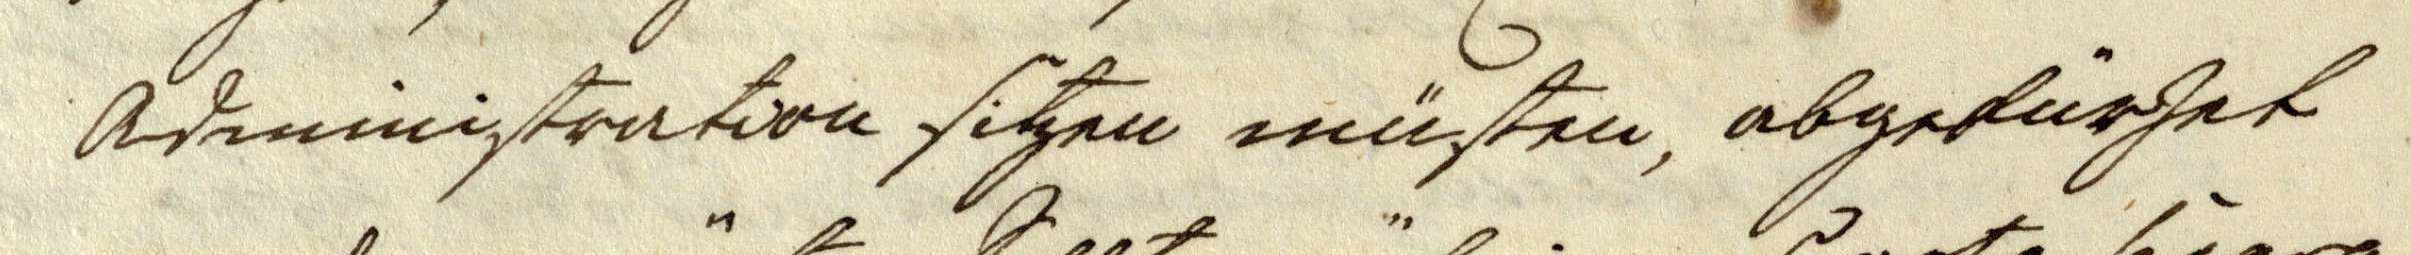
Administration sitzen müßten, abgekürzet
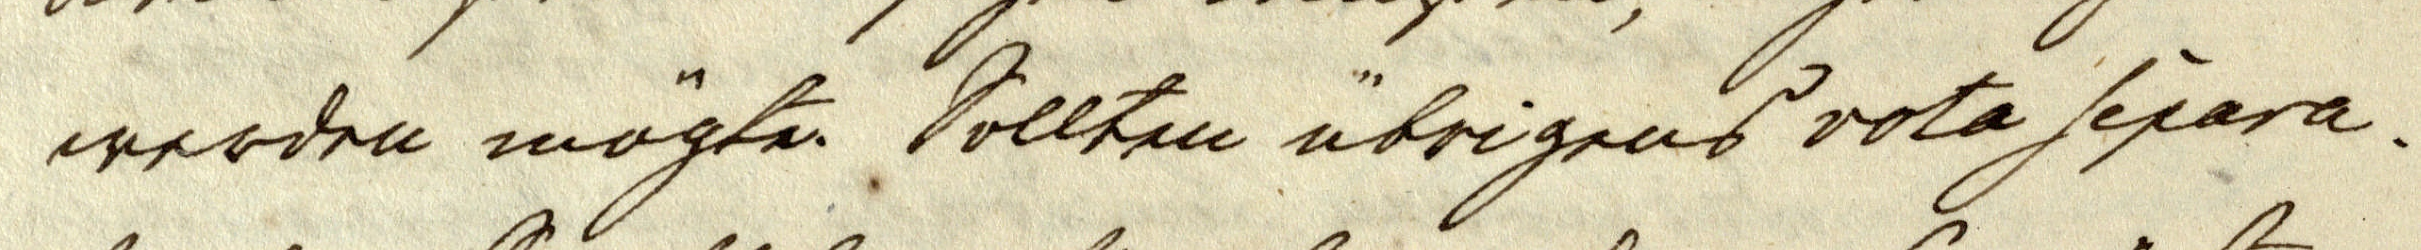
werden mögte. Sollten übrigens vota separa¬
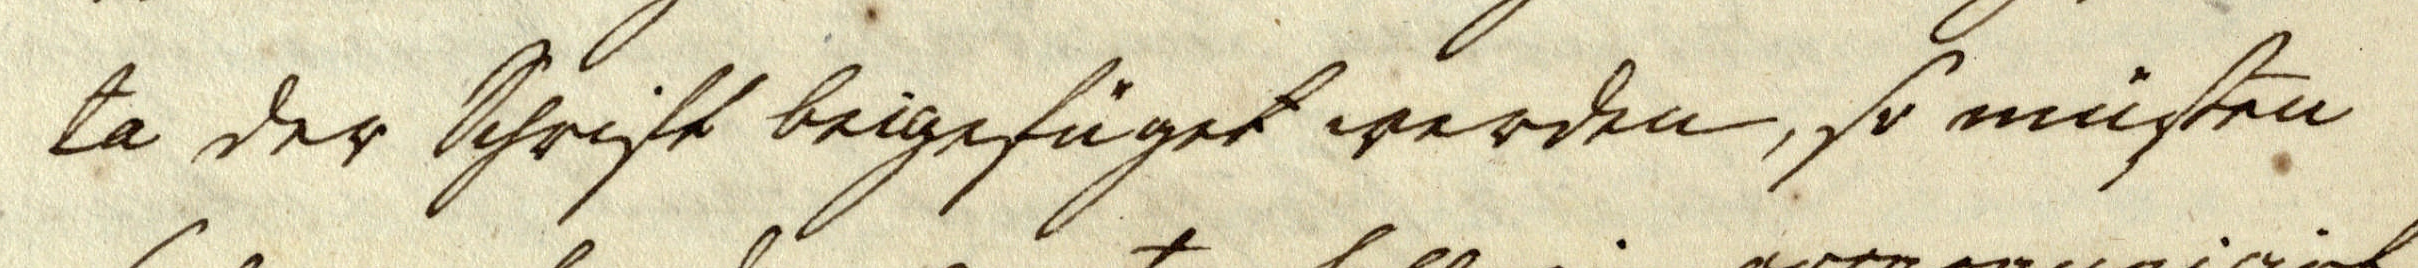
ta der Schrift beigefüget werden, so müsten
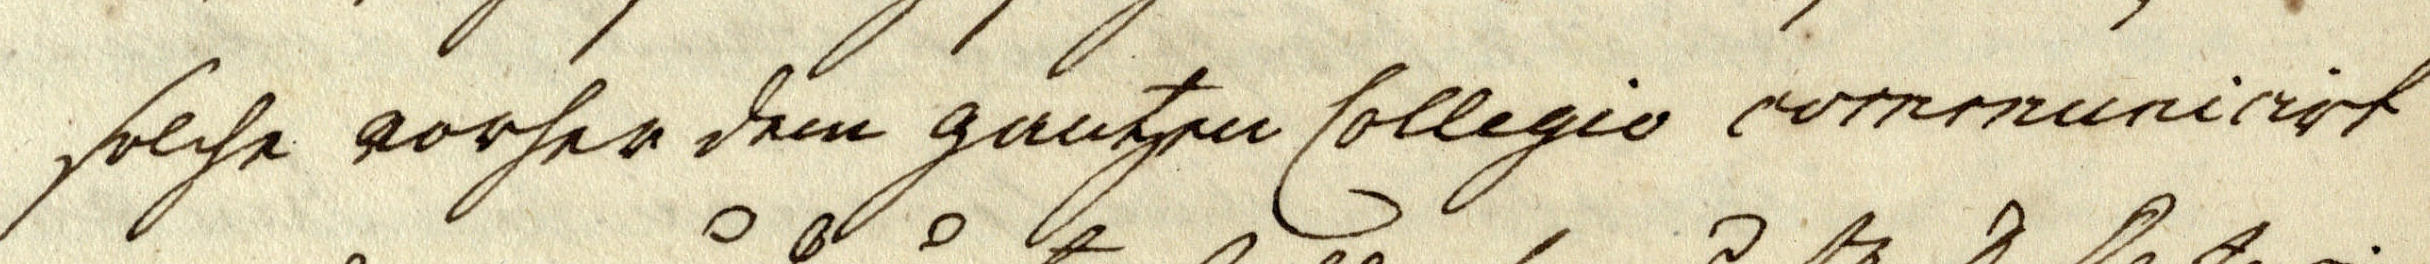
solche vorher dem gantzen Collegio communicirt
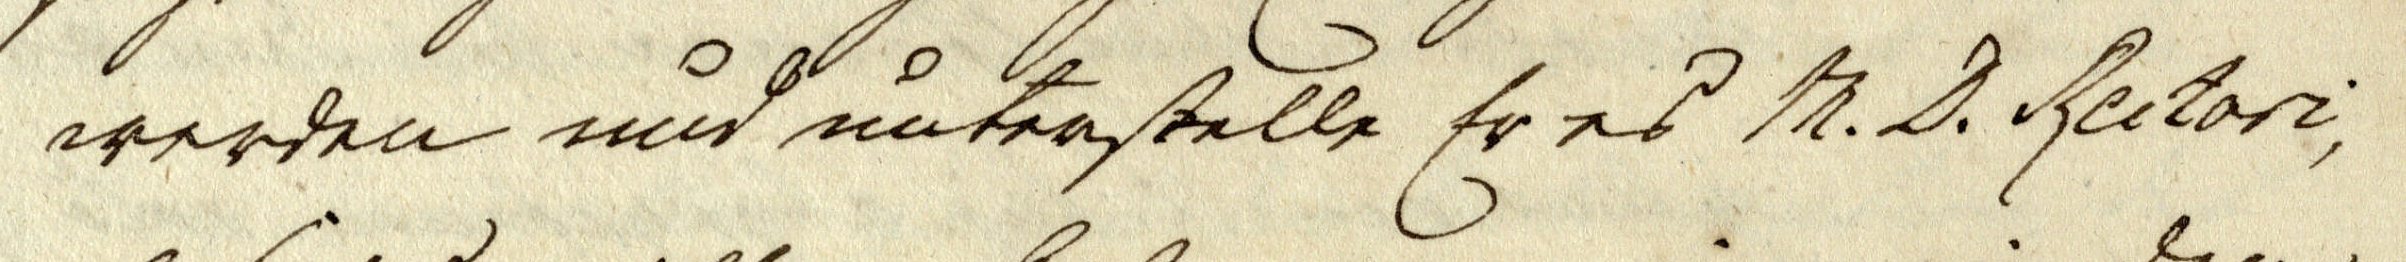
werden und unterstelle Er es M. D. Rectori,
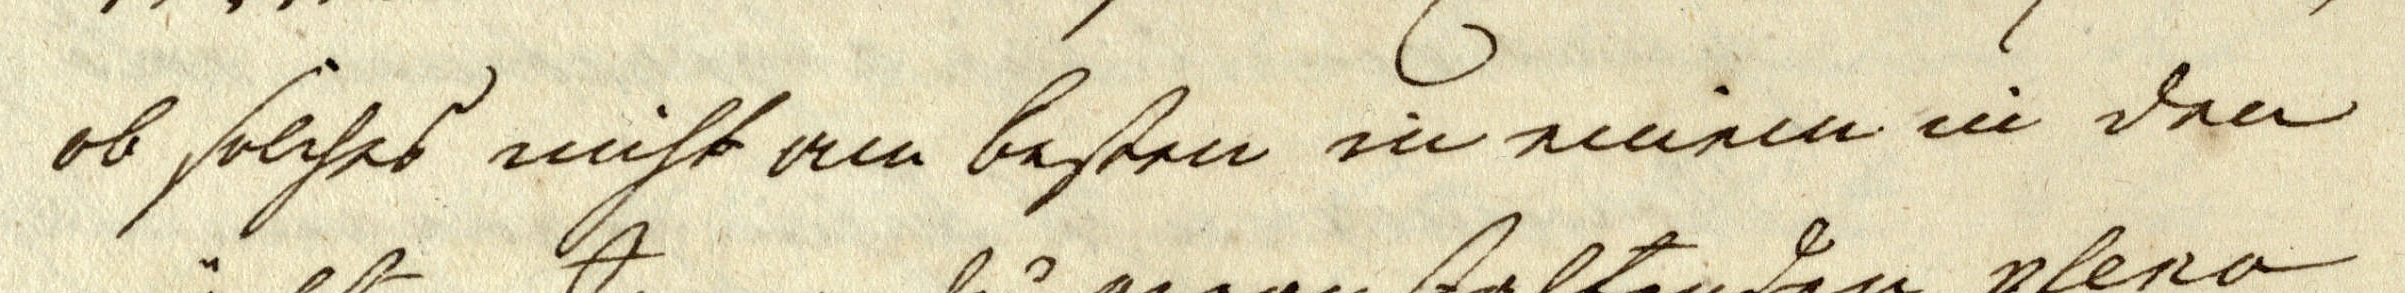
ob solches nicht am besten in einem in den
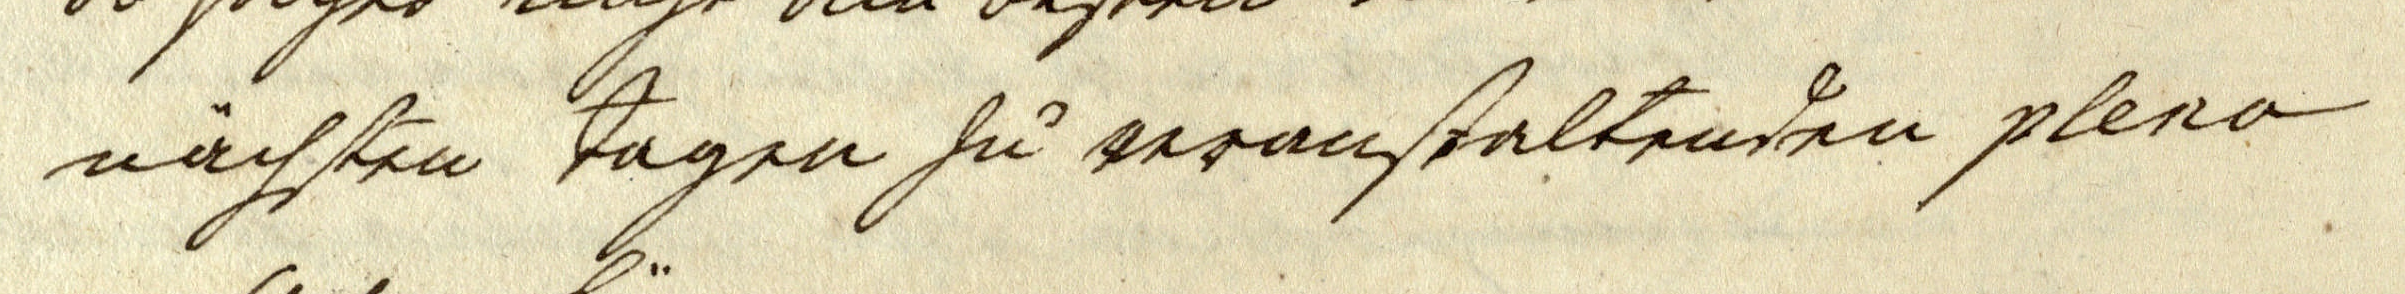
nächsten Tagen zu veranstaltenden pleno
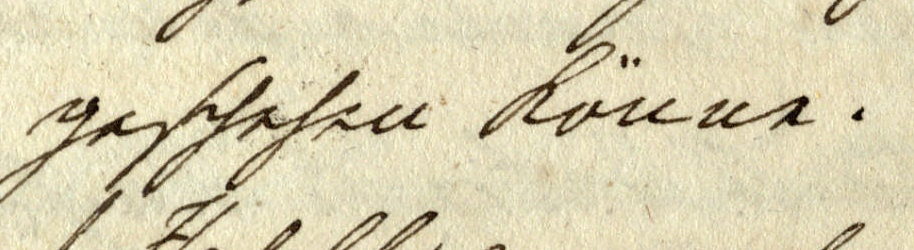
geschehen könne.
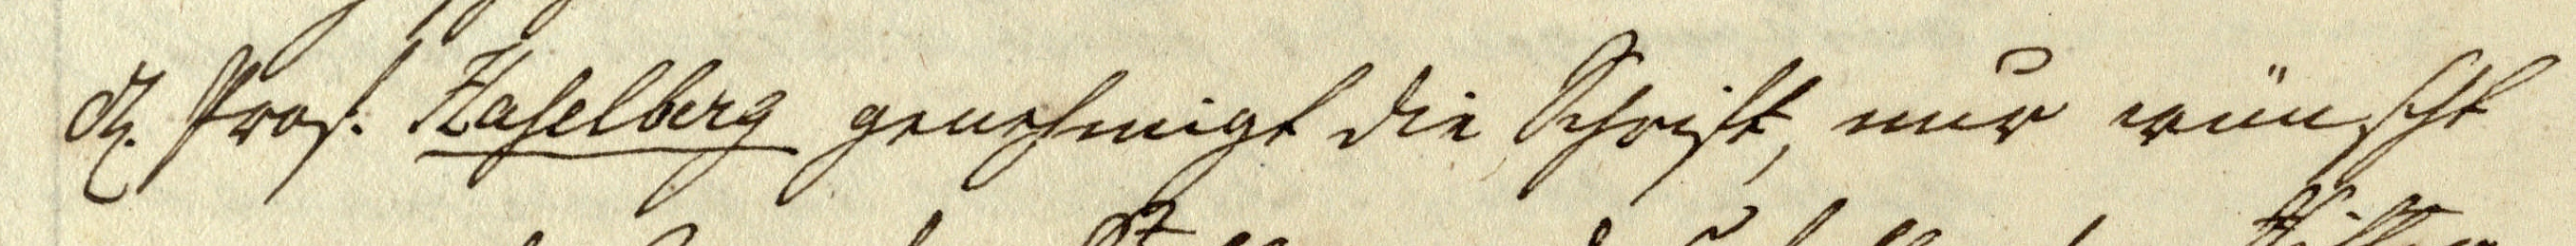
dh. Prof. Haselberg genehmigt die Schrift, nur wünscht
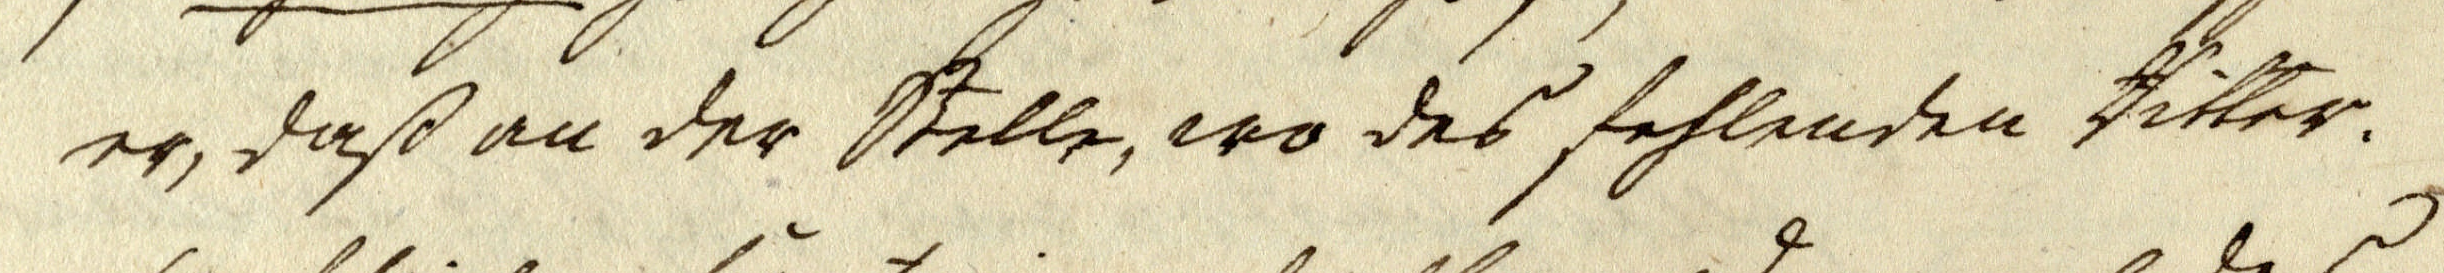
er, daß an der Stelle, wo des fehlenden Ritter¬
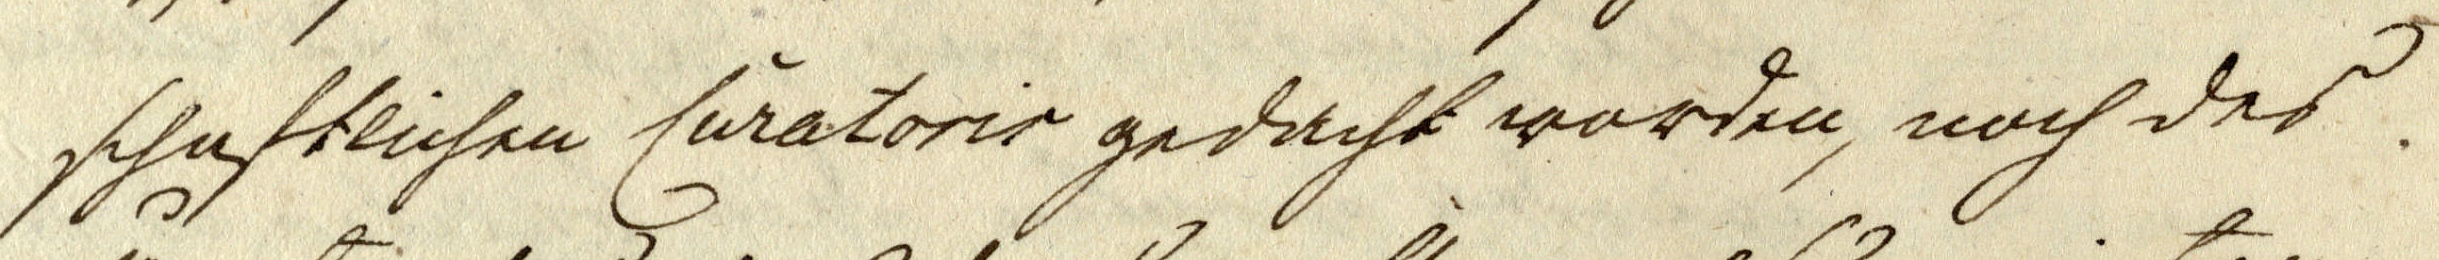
schaftlichen Curatoris gedacht worden, noch des
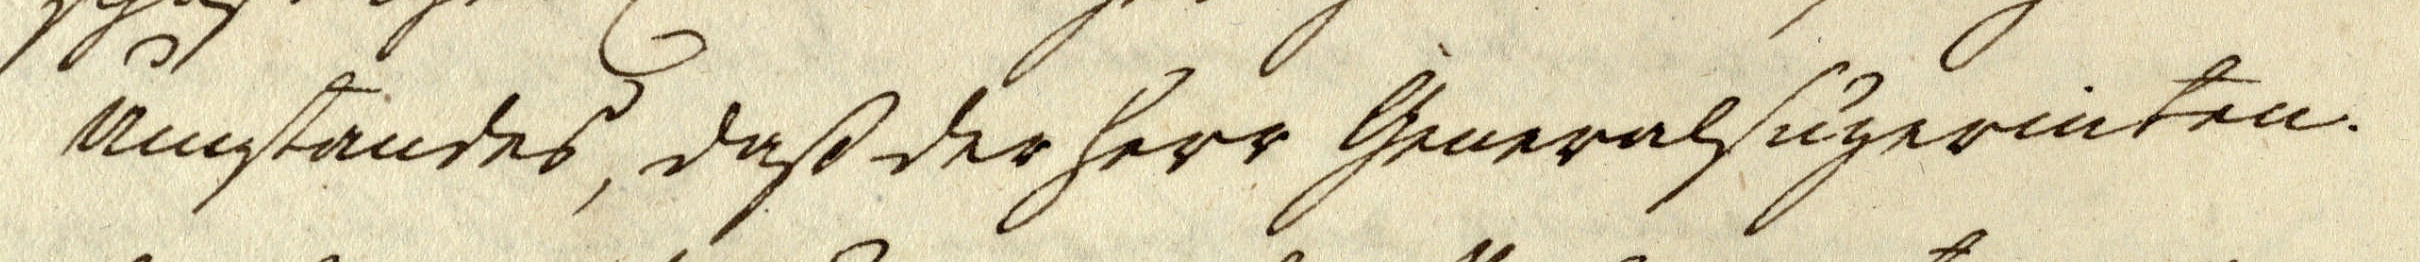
Umstandes, daß der Herr Generalsuperinten¬
